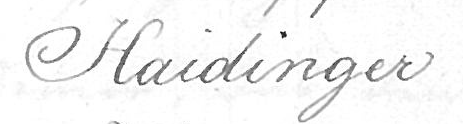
Haidinger
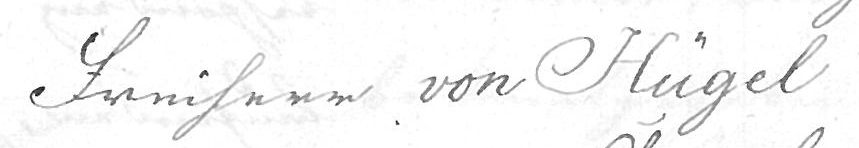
Freiherr von Hügel
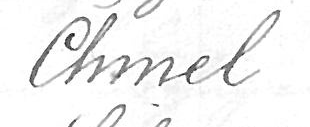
Chmel
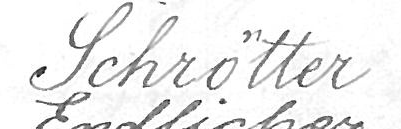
Schrötter
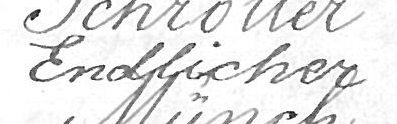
Endlicher
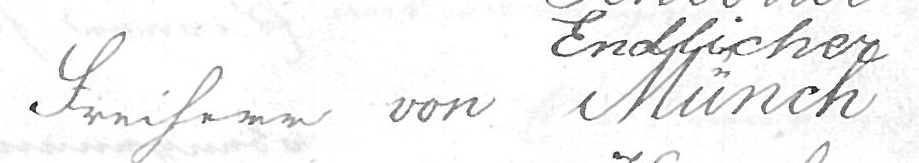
Freiherr von Münch
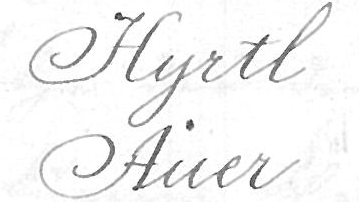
Hyrtl
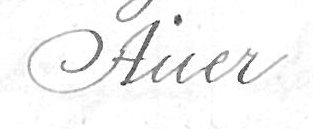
Auer
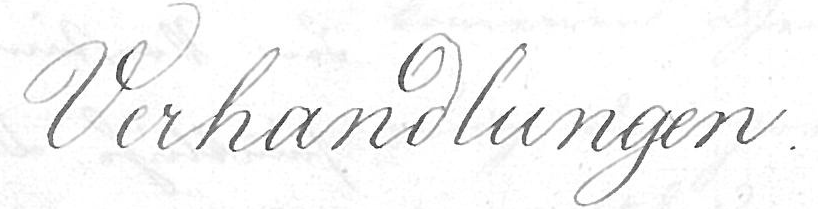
Verhandlungen
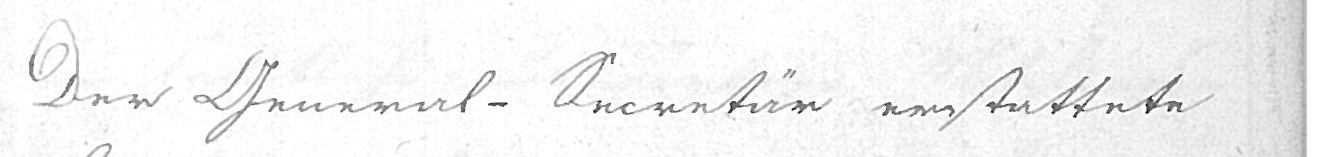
Der General-Secretär erstattete
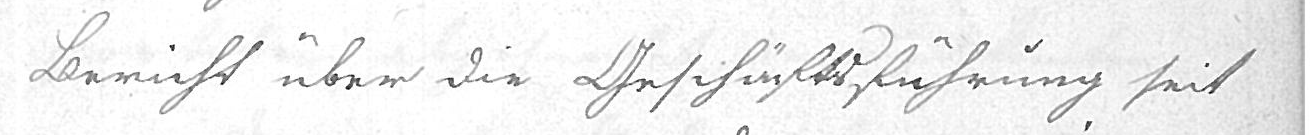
Bericht über die Geschäftsführung seit
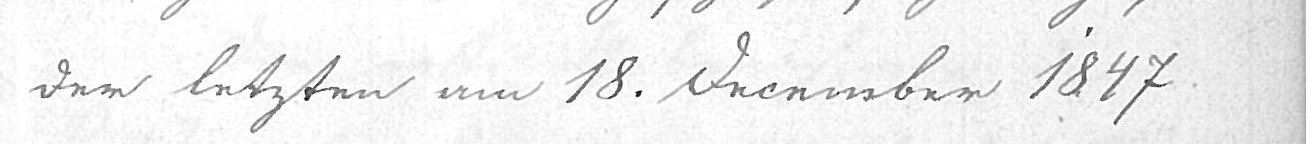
der letzten am 18. December 1847
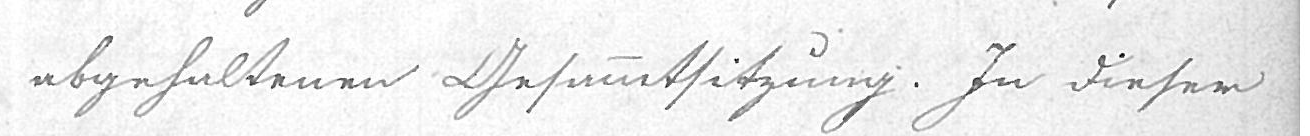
abgehaltenen Gesammtsitzung. In dieser
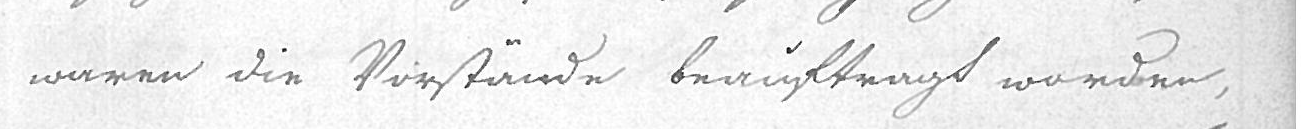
waren die Vorstände beauftragt worden,
